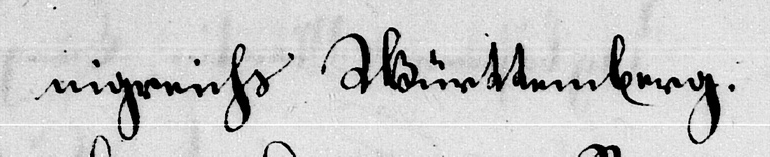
nigreichs Württemberg.
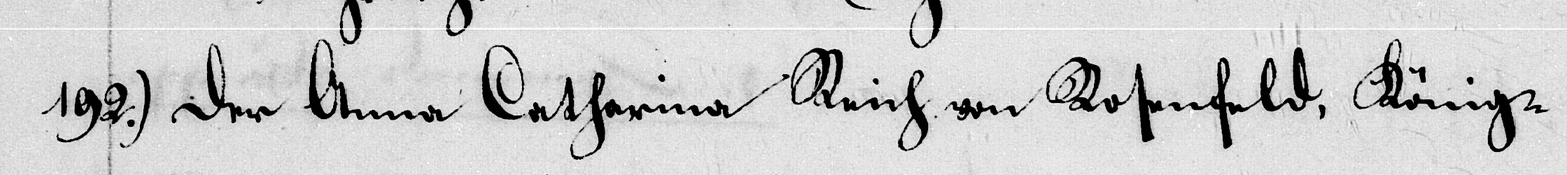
192.) Der Anna Catharina Reich von Rosenfeld, König¬
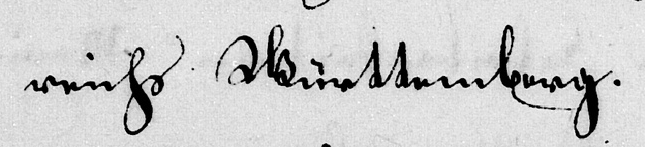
reichs Württemberg.
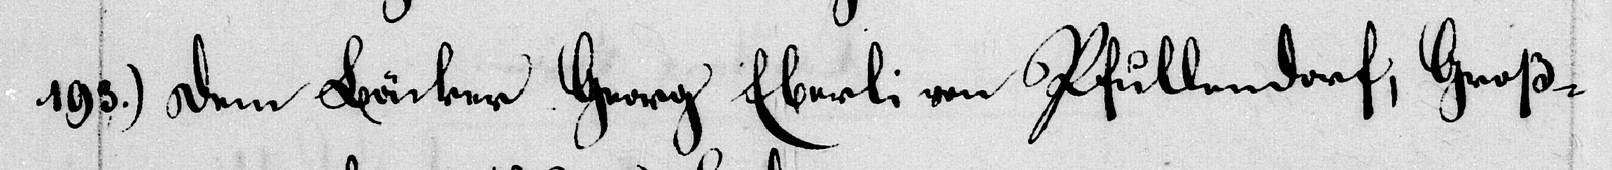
193.) Dem Bäcker Georg Eberli von Pfullendorf, Groß¬
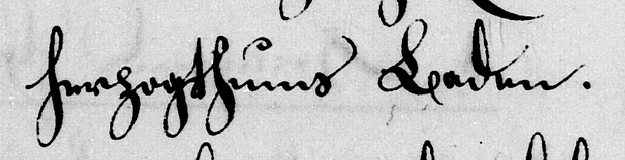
herzogthums Baden.
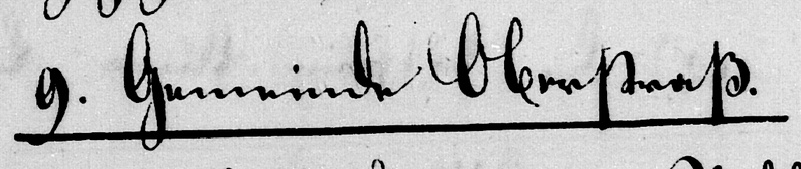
9. Gemeinde Oberstraß.
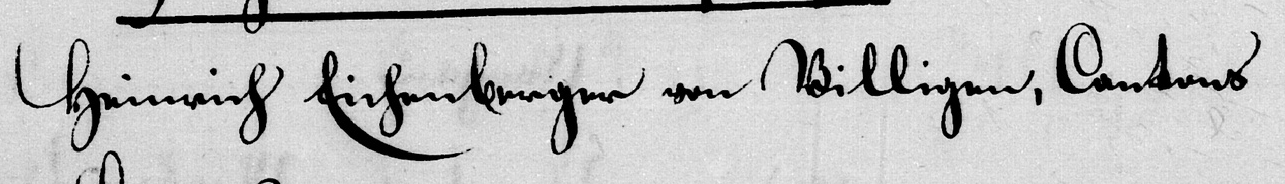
Heinrich Eichenberger von Villigen, Cantons
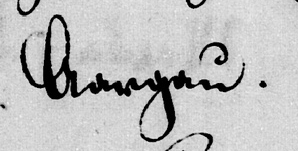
Aargau.
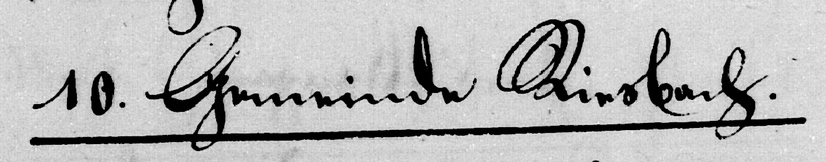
10. Gemeinde Riesbach.
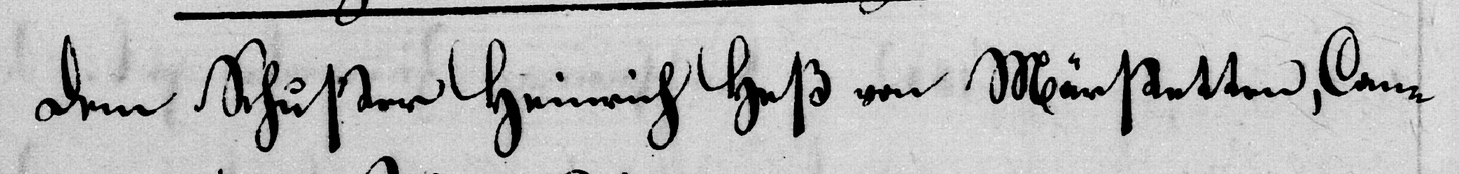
Dem Schuster Heinrich Heß von Märstetten, Can¬
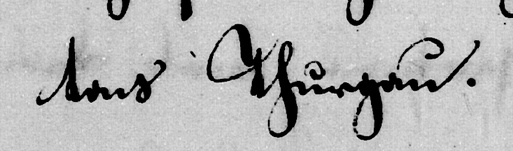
tons Thurgau.
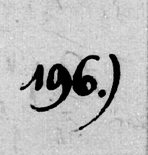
195.)
